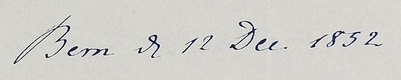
Bern den 12 Dec. 1852
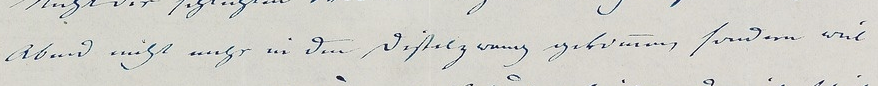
Abend nicht mehr in den Distelzwang gekommen, sondern weil
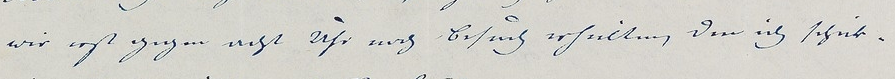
wir erst gegen acht Uhr noch Besuch erhielten, den ich schick-
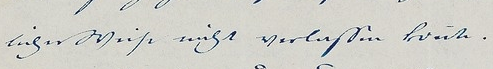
licher Weise nicht verlassen konnte.
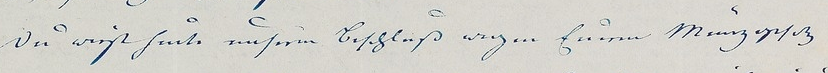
Du wirst heute unseren Beschluß wegen Euerm Münzgesetz
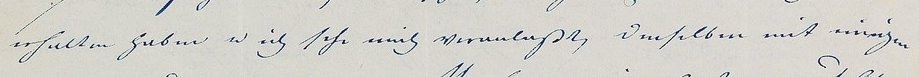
erhalten haben u ich sehe mich veranlaßt, denselben mit einigen
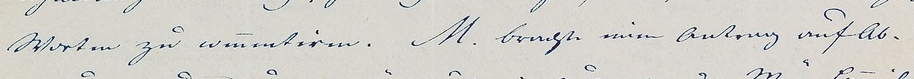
Worten zu commentiren. M. brachte einen Antrag auf Ab-
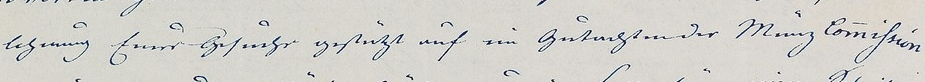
lehnung Eures Gesuchs gestützt auf ein Gutachten der Münz Commission
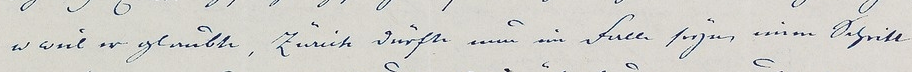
u weil er glaubte, Zürich dürfte nun im Falle seyn, einen Schritt
